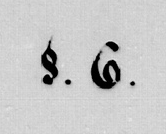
§. 6.
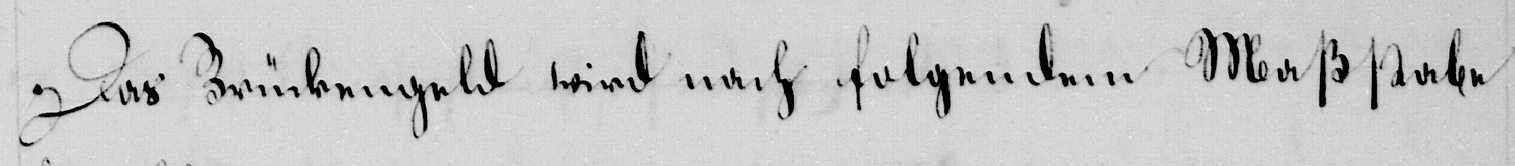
Das Brückengeld wird nach folgendem Maßstabe
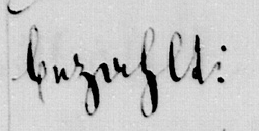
bezahlt:
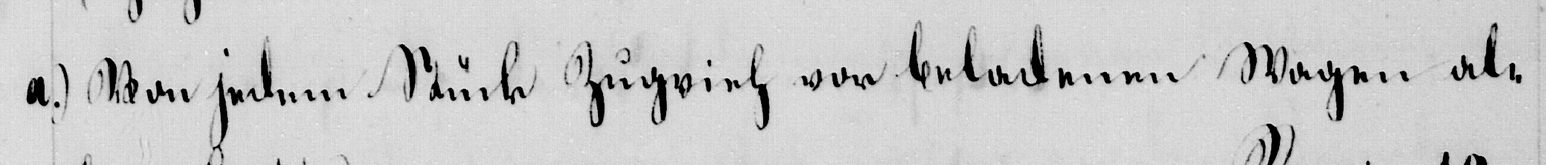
a.) Von jedem Stück Zugvieh vor beladenen Wagen al¬
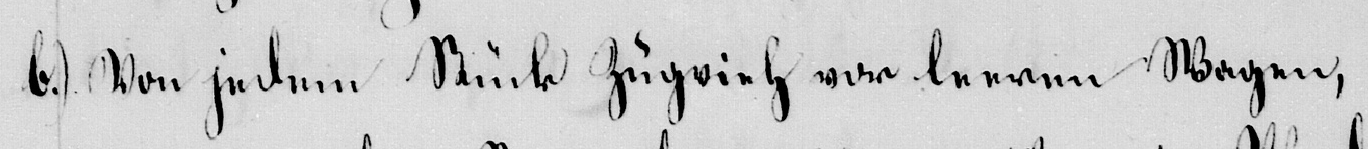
b.) Von jedem Stück Zugvieh vor leerem Wagen,
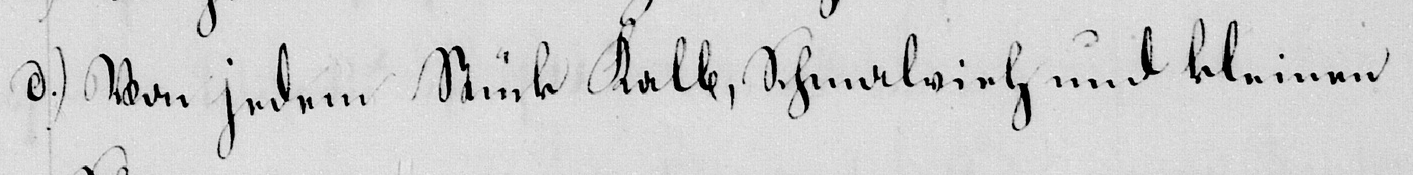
d.) Vor jedem Stück Kalb, Schmalvieh und kleinen
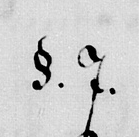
§. 7.
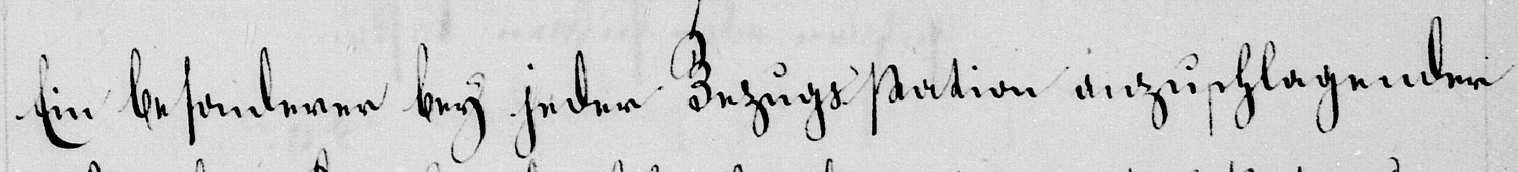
Ein besonderer bey jeder Bezugsstation anzuschlagender
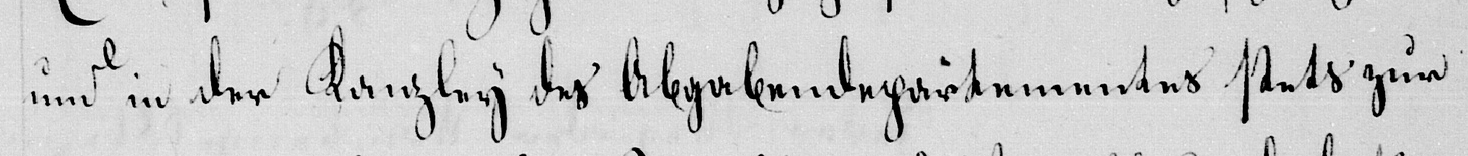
und in der Kanzley des Abgabendepartements stets zur
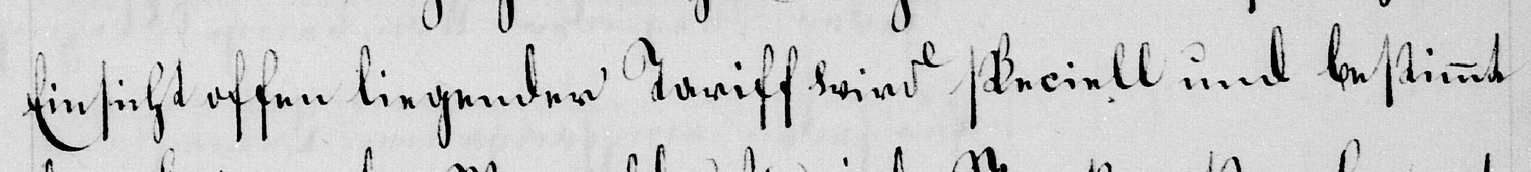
Einsicht offen liegender Tariff wird speciell und bestimmt
